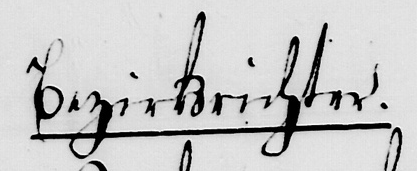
Bezirksrichter.
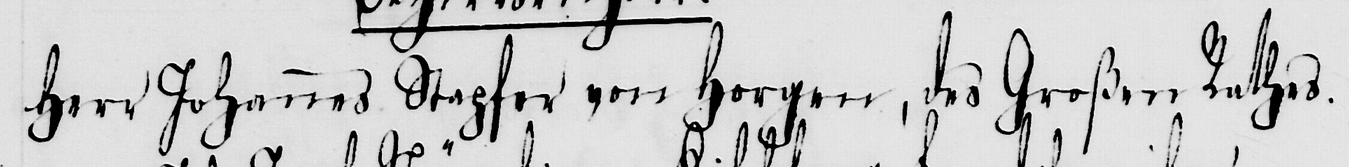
Herr Johannes Stapfer von Horgen, des Großen Rathes.
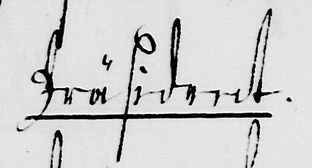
Präsident.
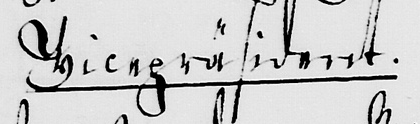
Vicepräsident.
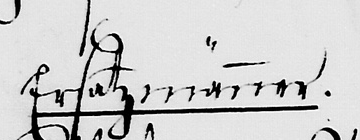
Ersatzmänner.
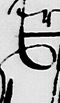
“
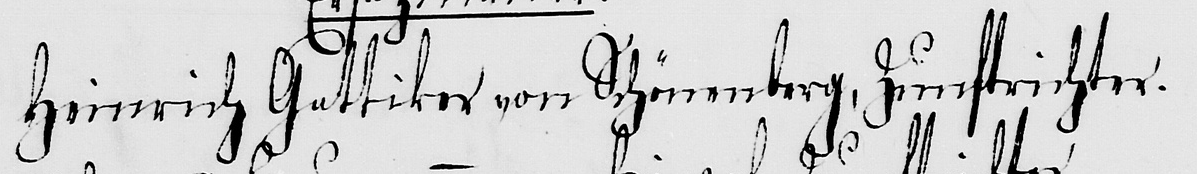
Heinrich Gattiker von Schönenberg, Zunftrichter.
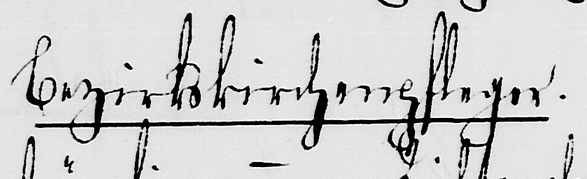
Bezirksschulpfleger.
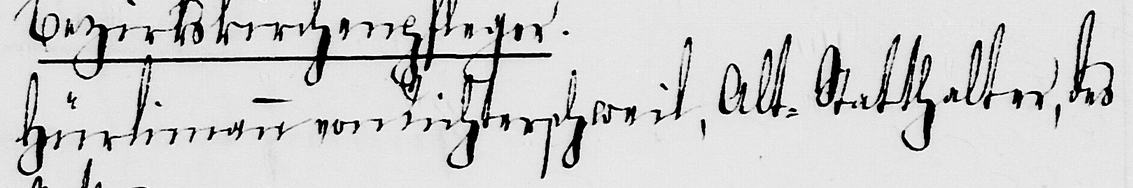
Hürlimann von Richterschweil, Alt-Statthalter, des
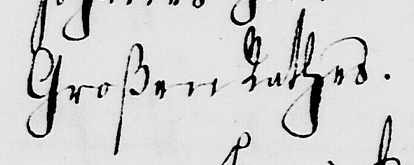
Großen Rathes.
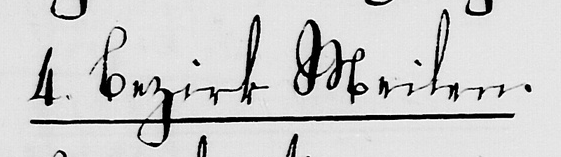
4. Bezirk Meilen.
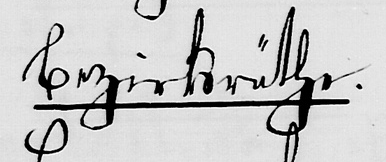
Bezirksräthe.
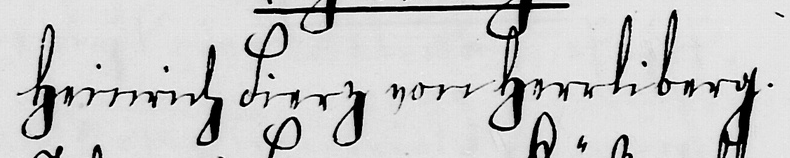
Heinrich Fierz von Herrliberg.
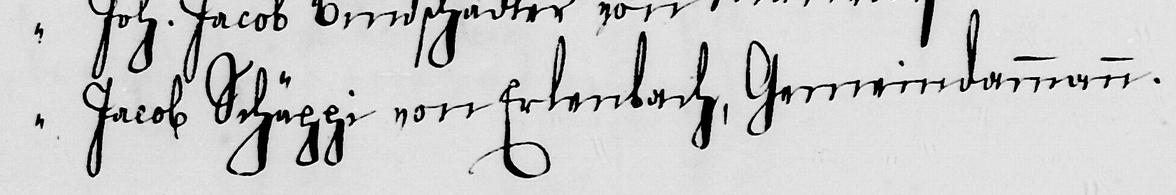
“ Jacob Schäppi von Erlenbach, Gemeindammann.
